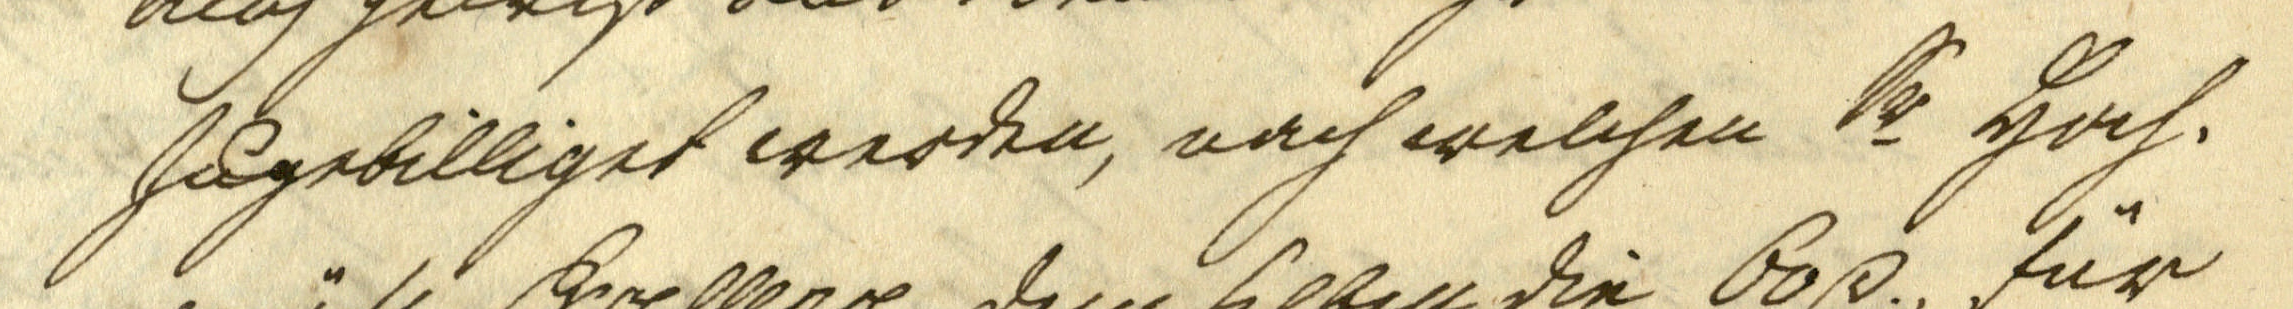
zugebilliget werden, nach welchen Sr Hoch¬
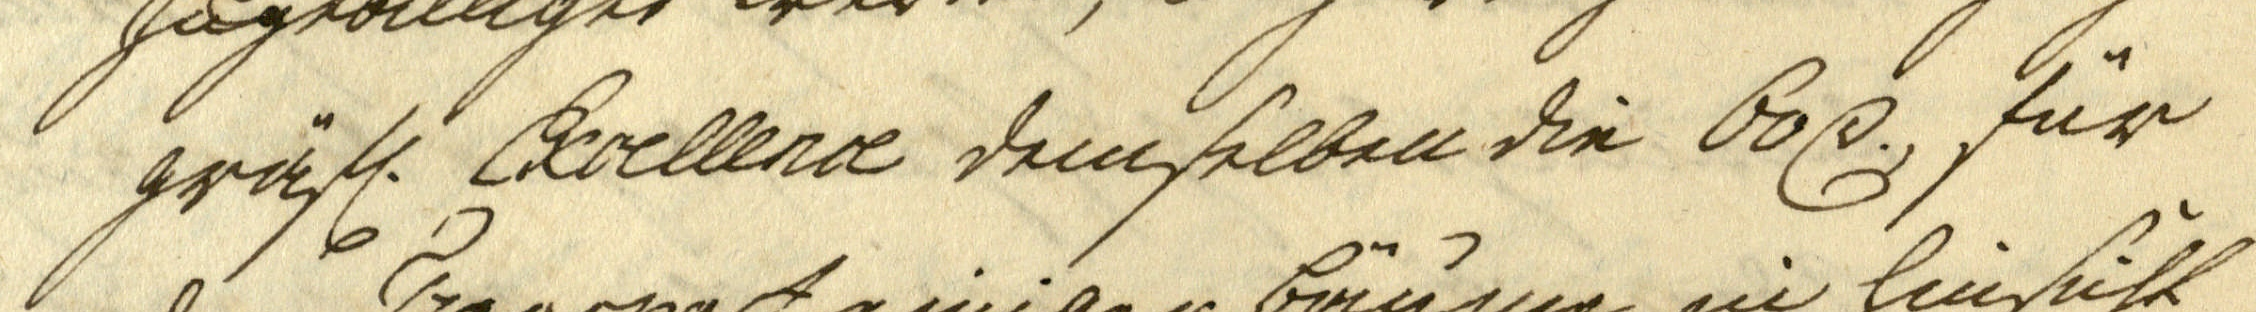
gräfl. Excellence demselben die 60 l., für
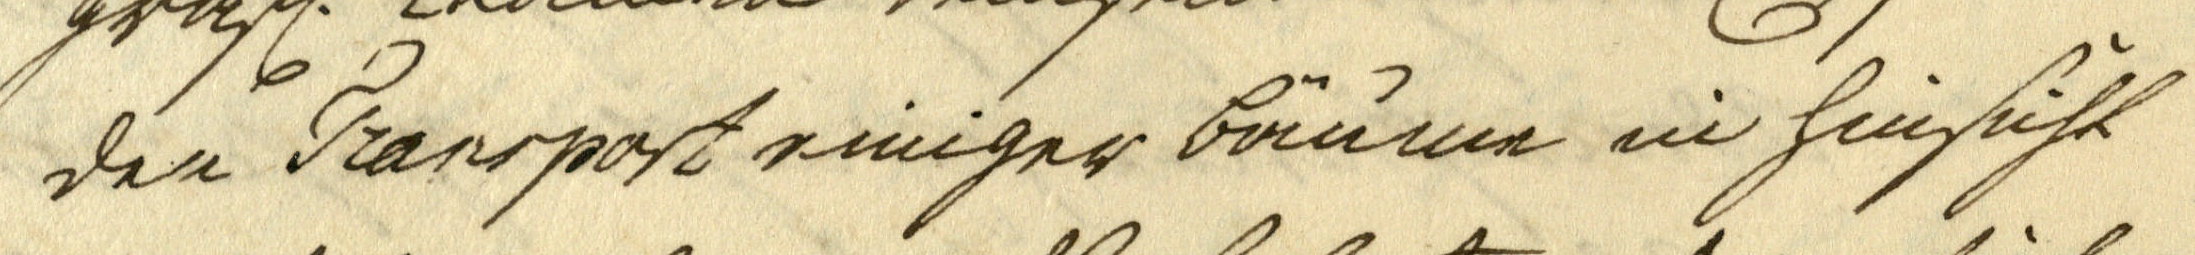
den Transport einiger Bäume in Hinsicht
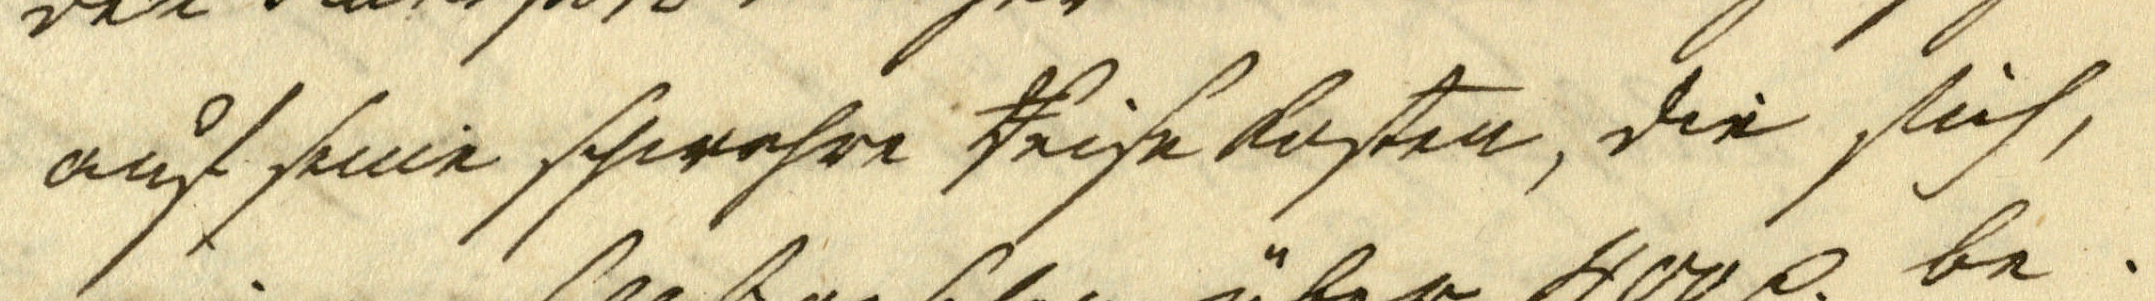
auf seine schwehre Reise kosten, die sich,
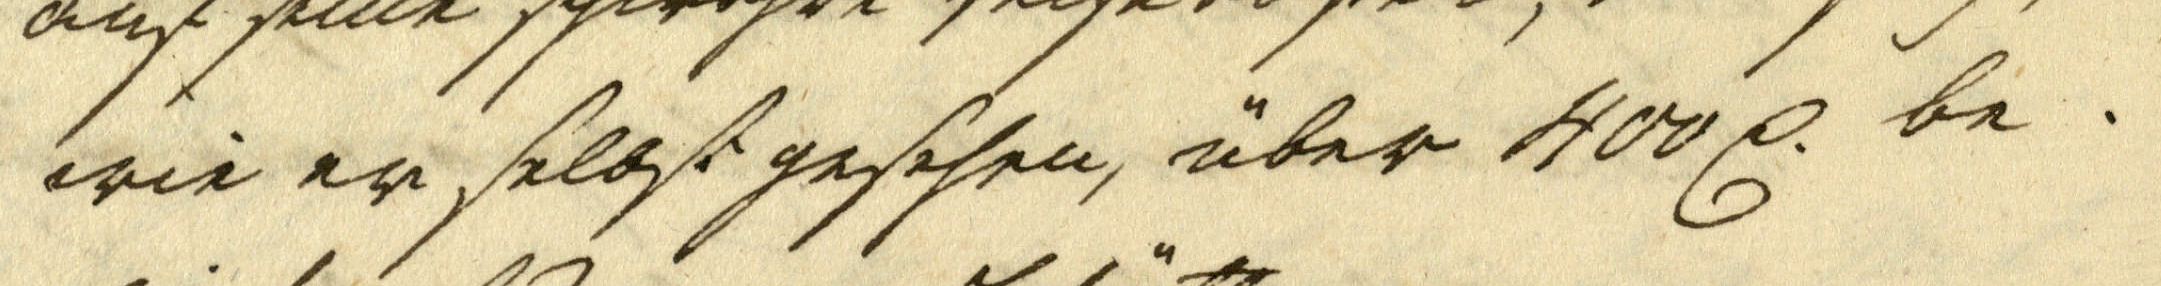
wie er selbst gesehen, über 400 l. be¬
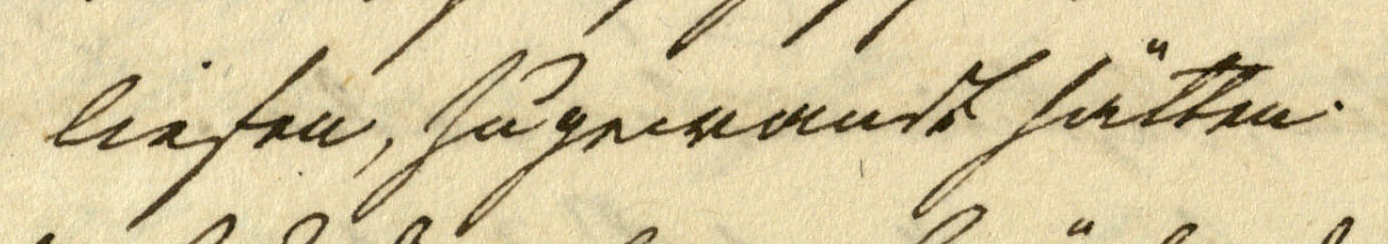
liefen, zugewandt hätten.
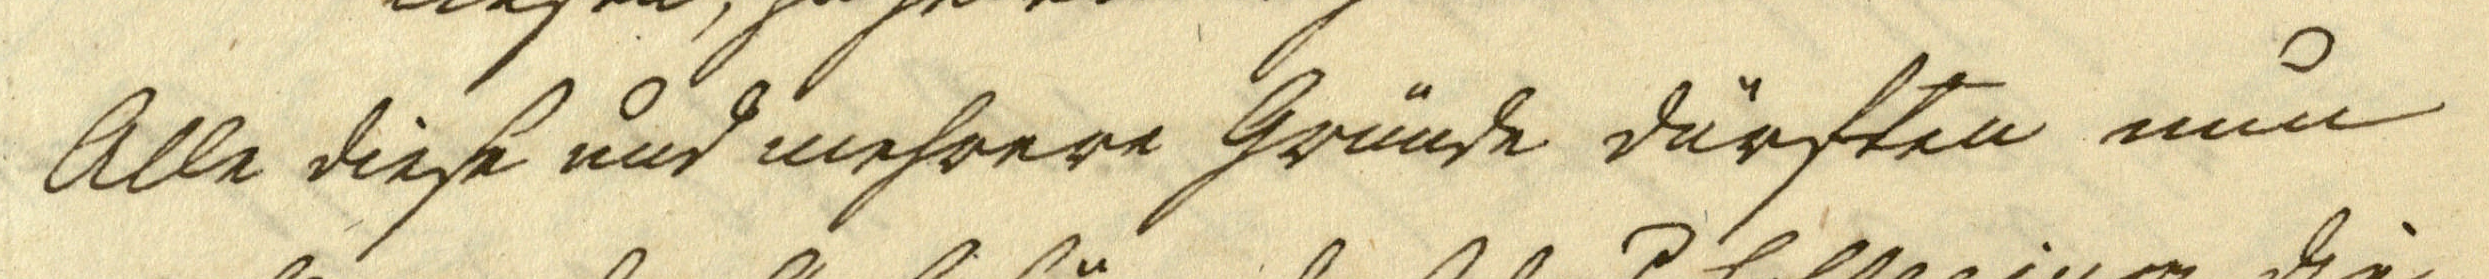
Alle diese und mehrere Gründe dürften nun
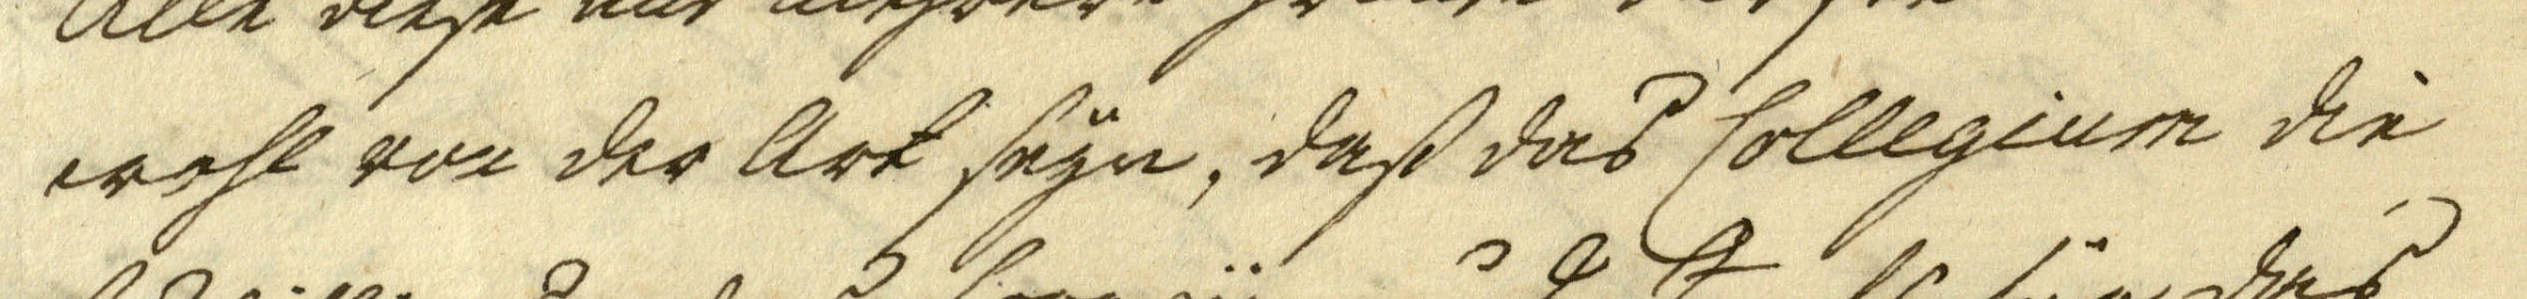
wohl von der Art seÿn, daß das Collegium die
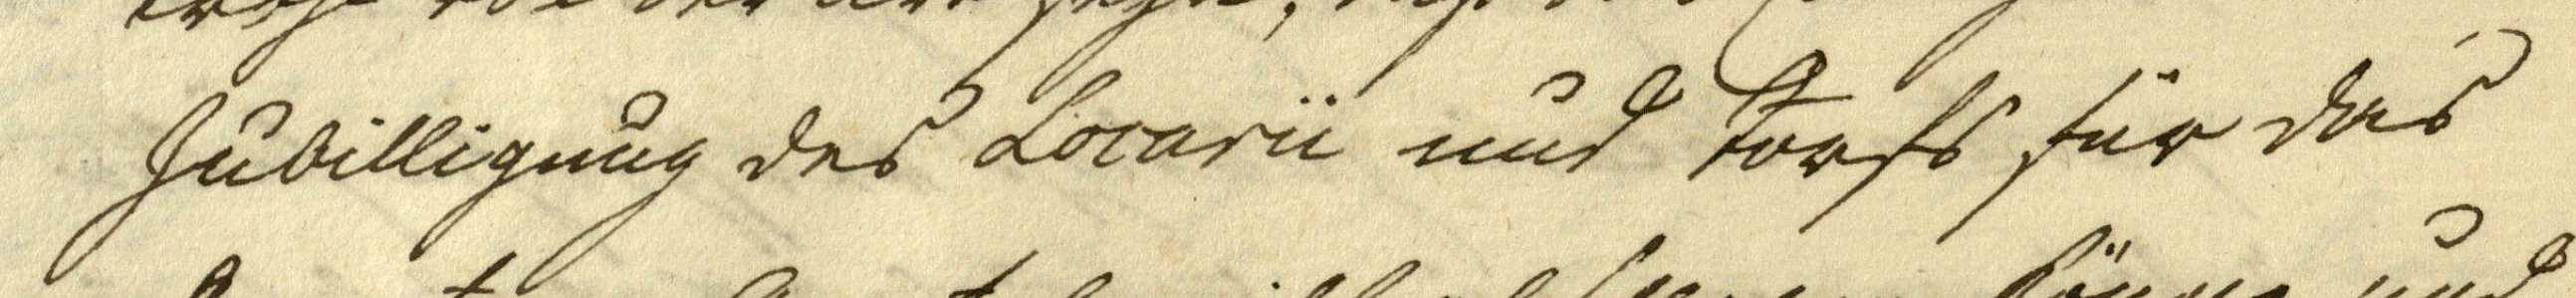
Zubilligung des Locarii und Torfs für das
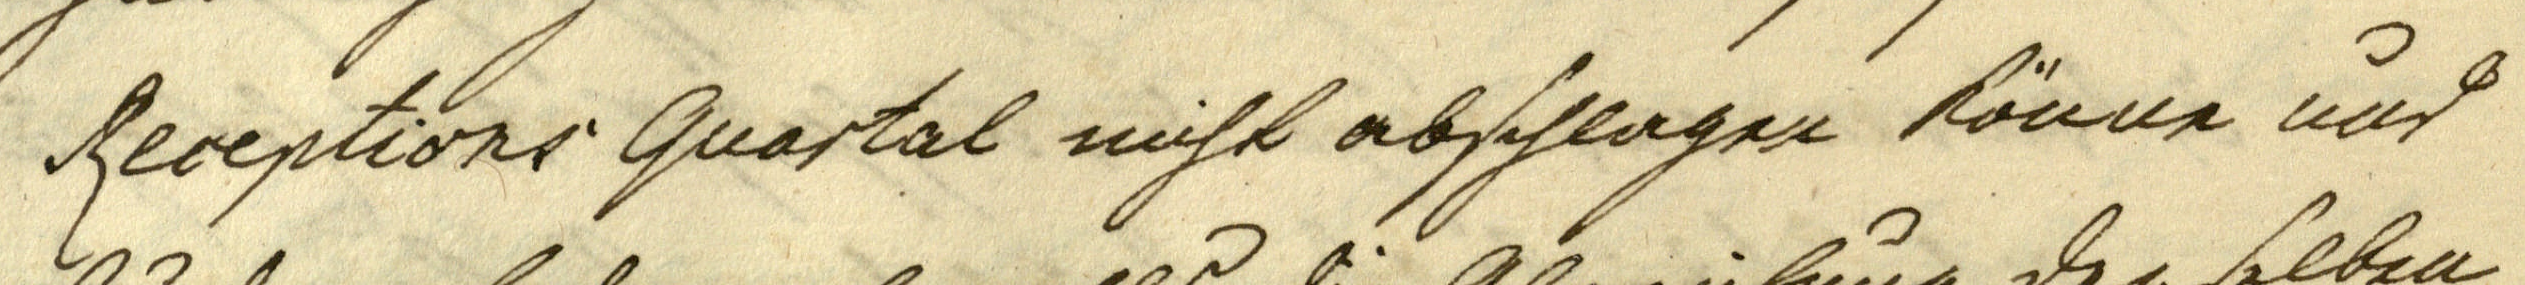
Receptions Quartal nicht abschlagen könne und
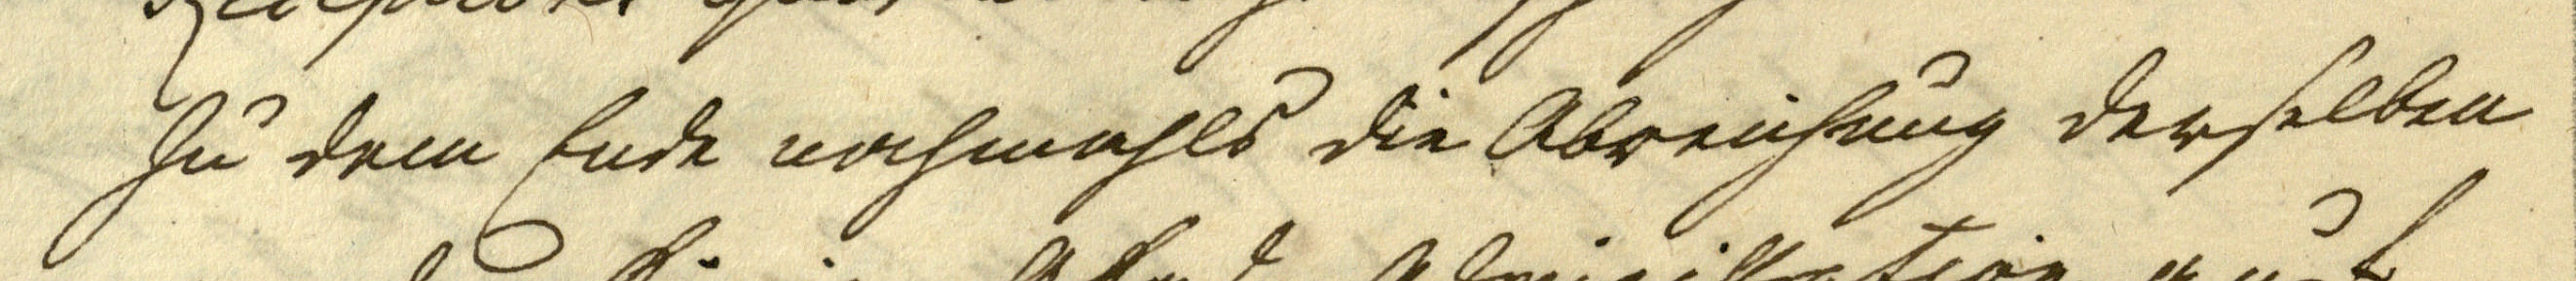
zu dem Ende nochmahls die Abreichung derselben
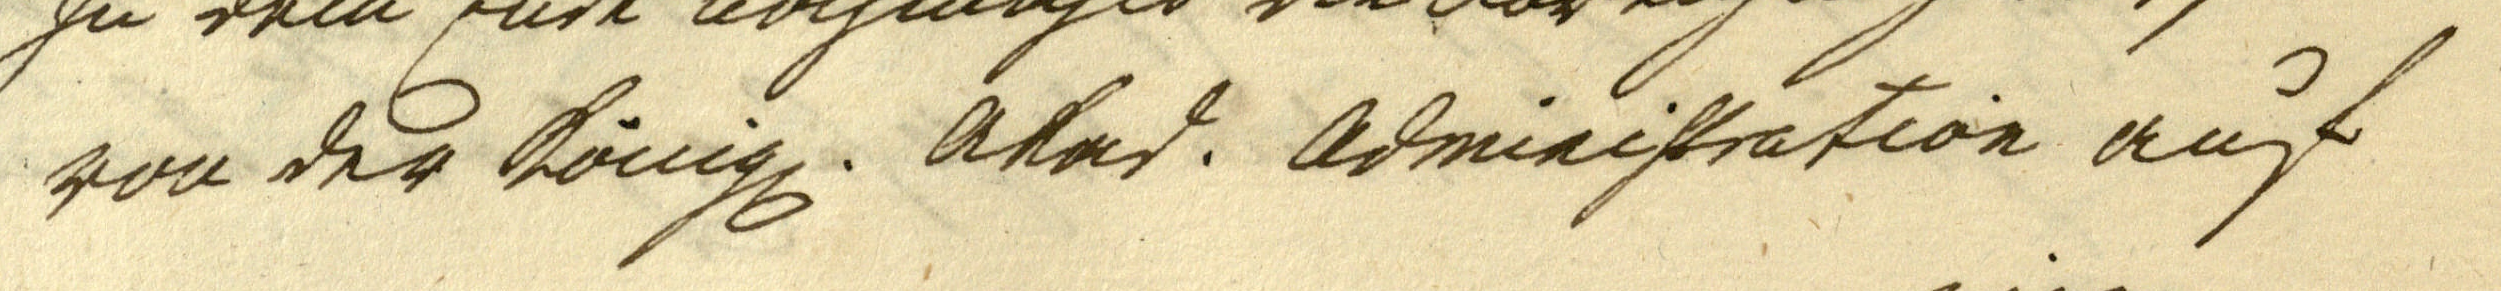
von der Königl. Akad. Administration auf
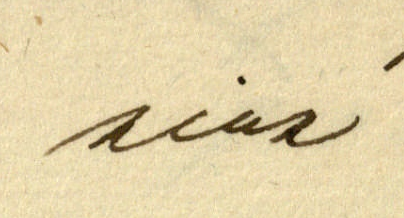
eine
